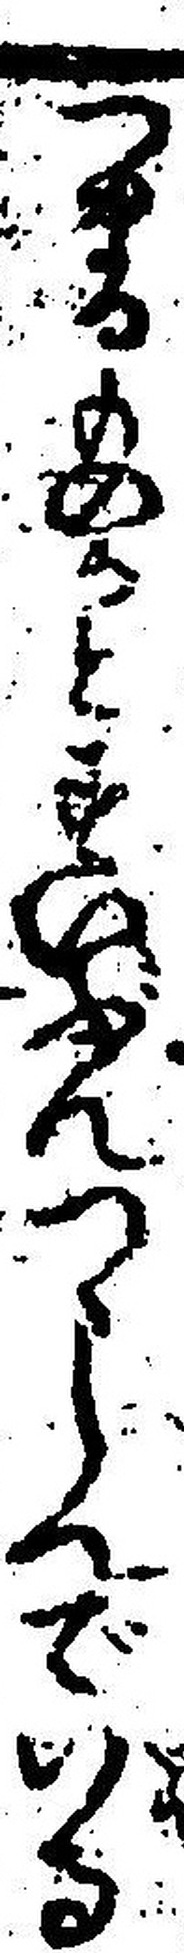つまるものかとすいぶんつゝしんでいる

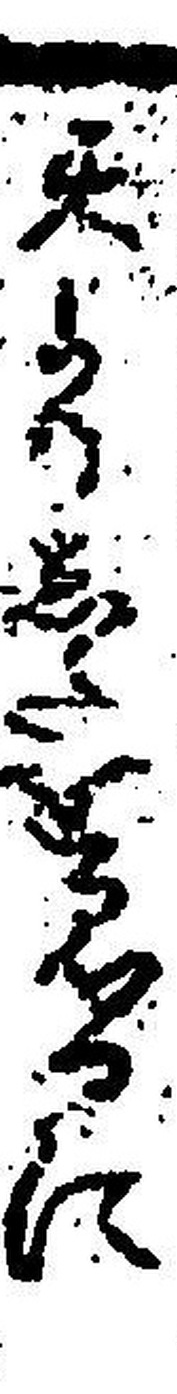天よりしたをみるに
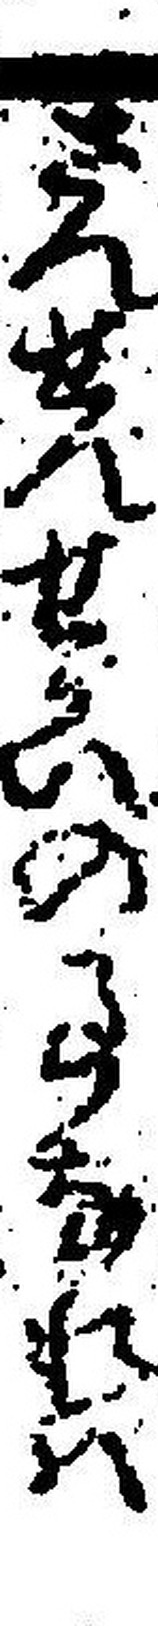さんせんせかいの事なれは
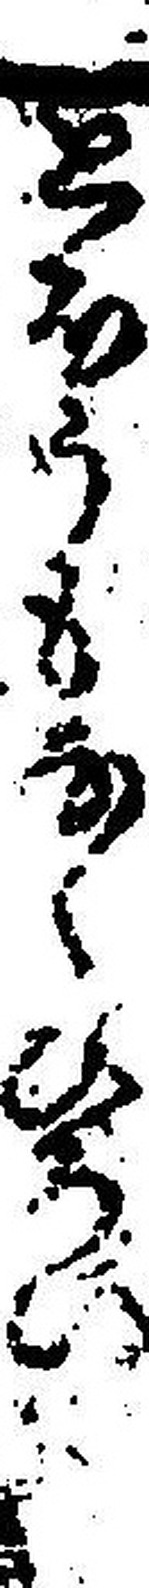とほうもなくひろい
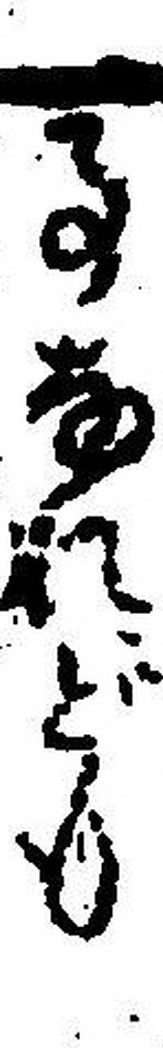事なれども
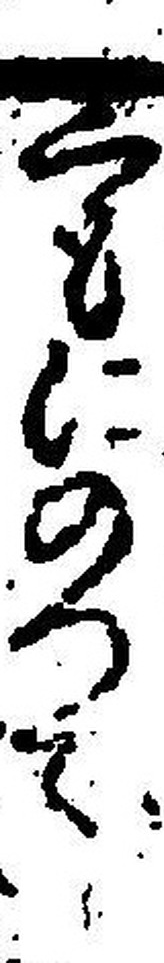くもにのつて
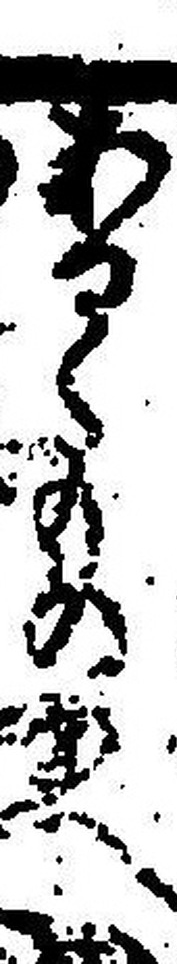あるくものゆへ
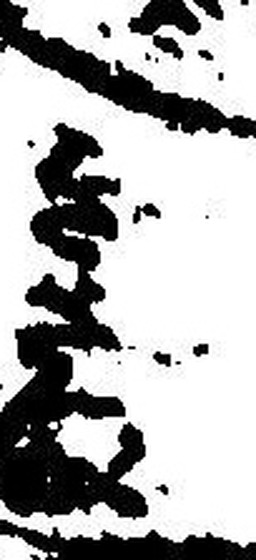きさま
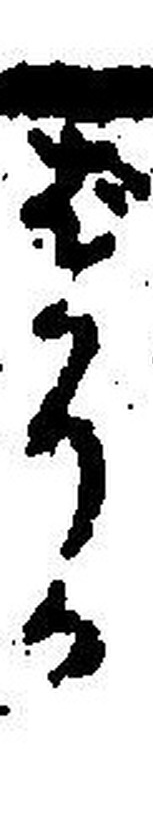ばかりか
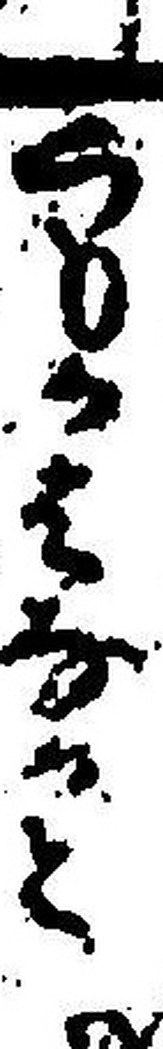くもかはなかと
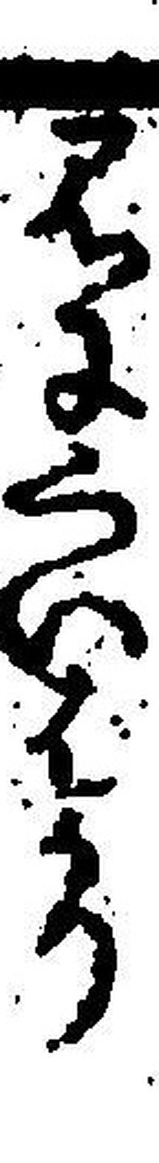見るくらいばかり
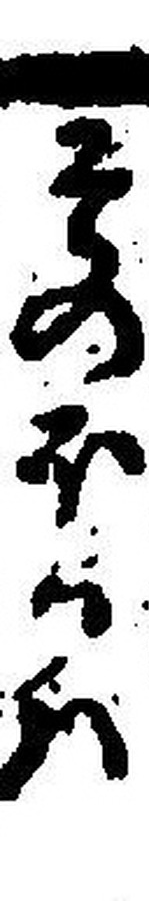そのほかは
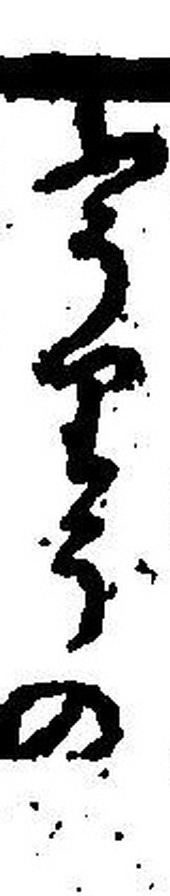ふうりうの
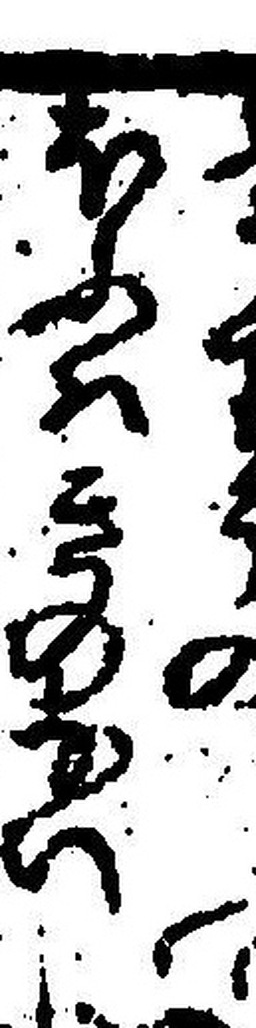ほふはきのない
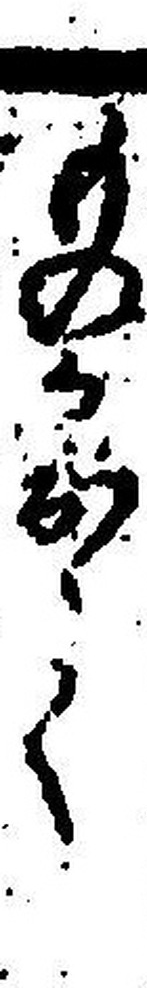ものかおゝく
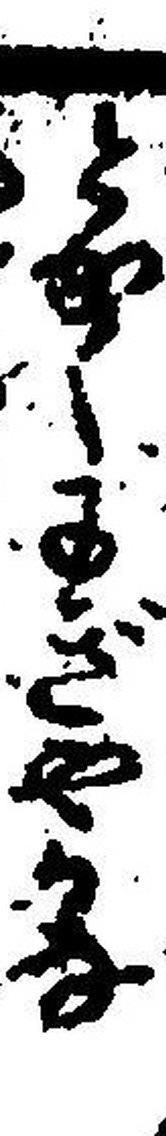とかくにぎやかな
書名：天竺儲之筋 / 市場通笑作
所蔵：東京大学総合図書館 General Library in the University of Tokyo, JAPAN
